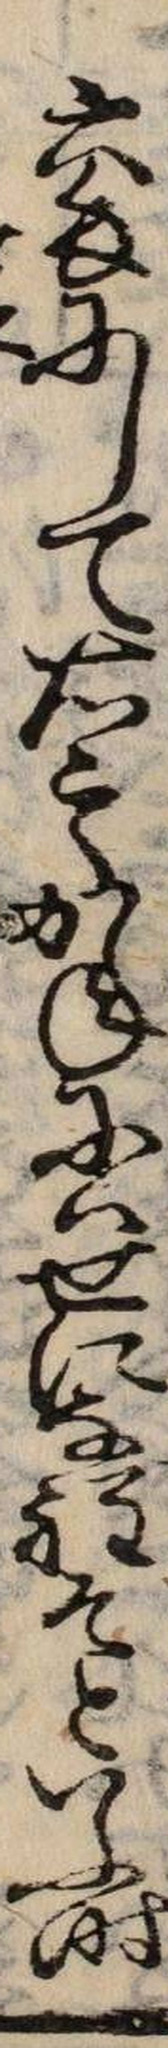六匁にして右のかねにはせになに程そといふ時
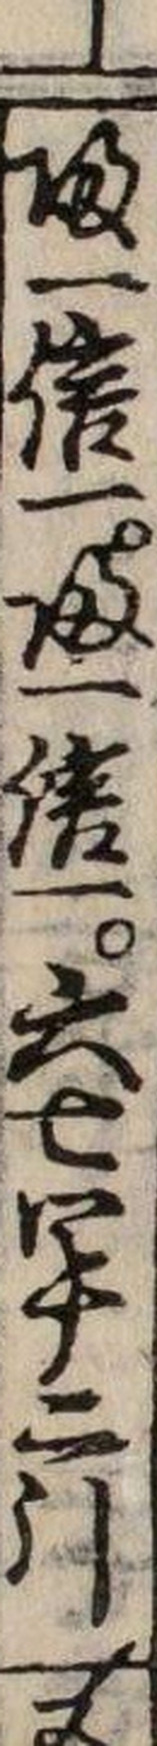匁６帰一倍一。帰一倍一六七四十二引。
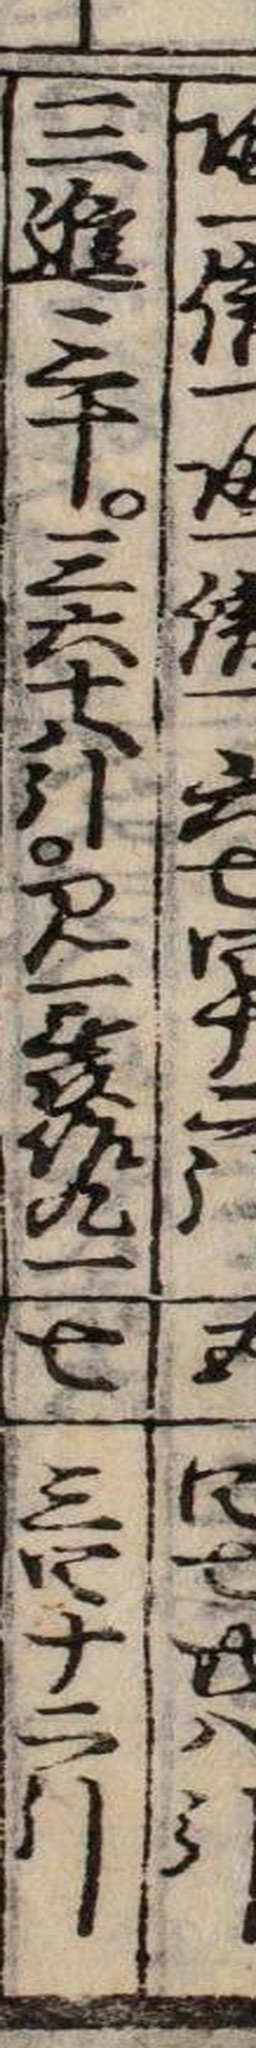三進三十。三六十八引。見一無頭作九一七三四十二引
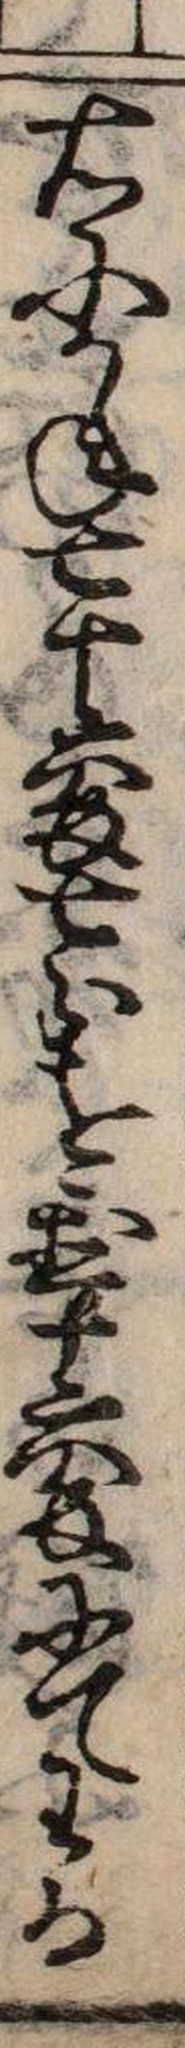一６右にかね七十六匁七分を置十六匁にてわる
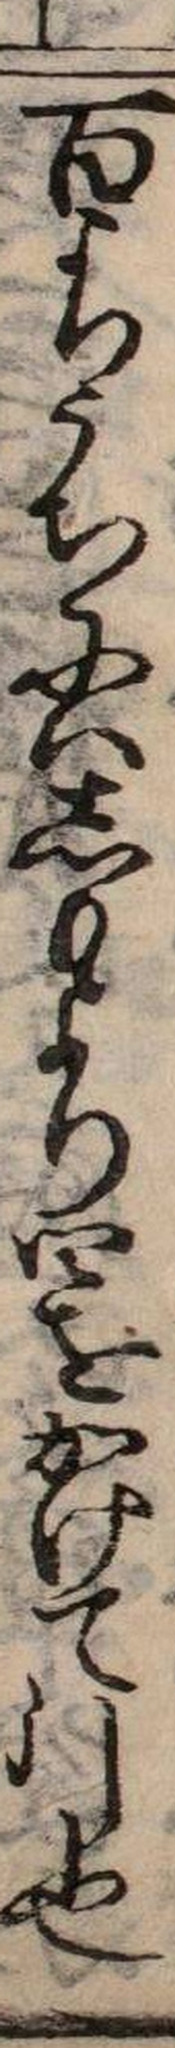十１百よりうちにはしもより四をかけて引也

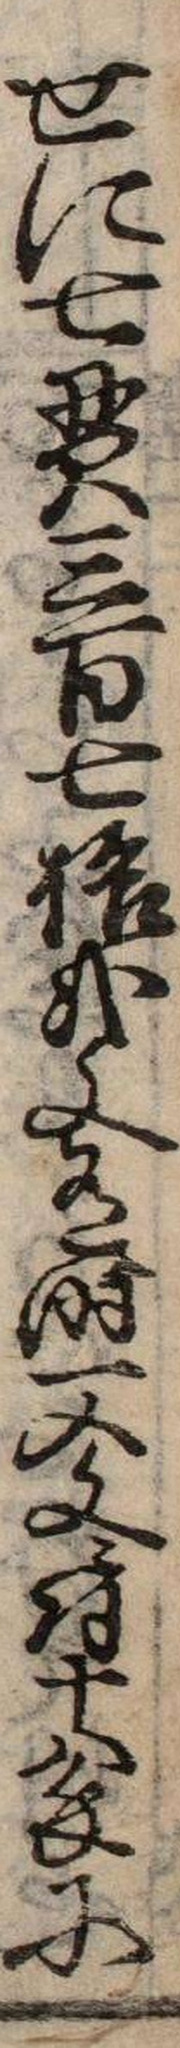せに七貫三百七拾弐文有時一貫文に付十八匁に
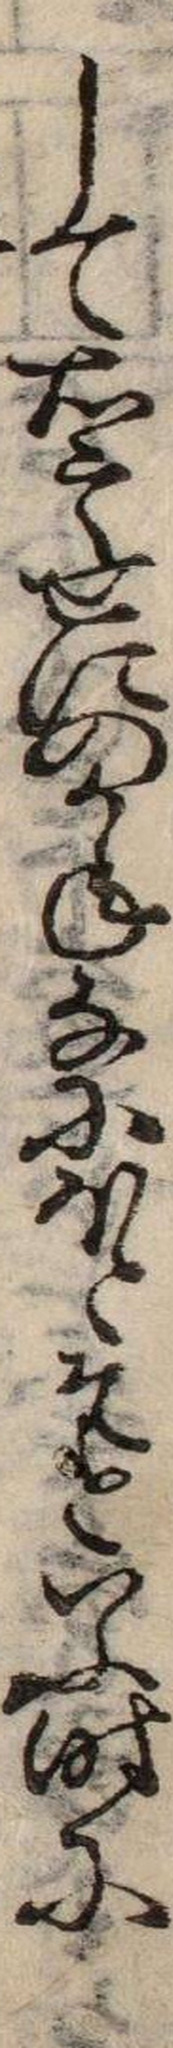して右のせにのかねなにほとそといふ時に
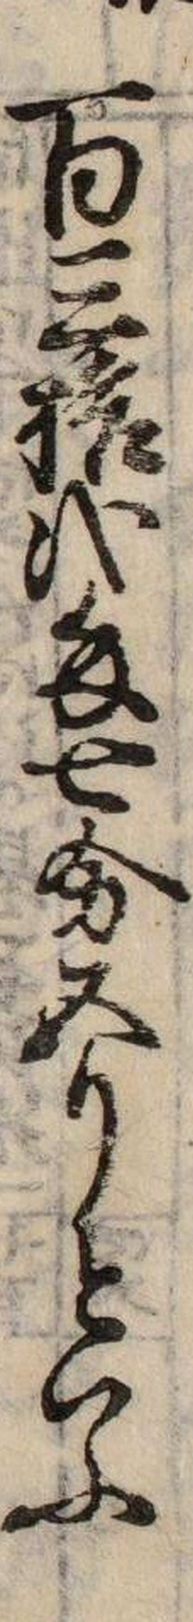銀百三拾弐匁七分五りといふ
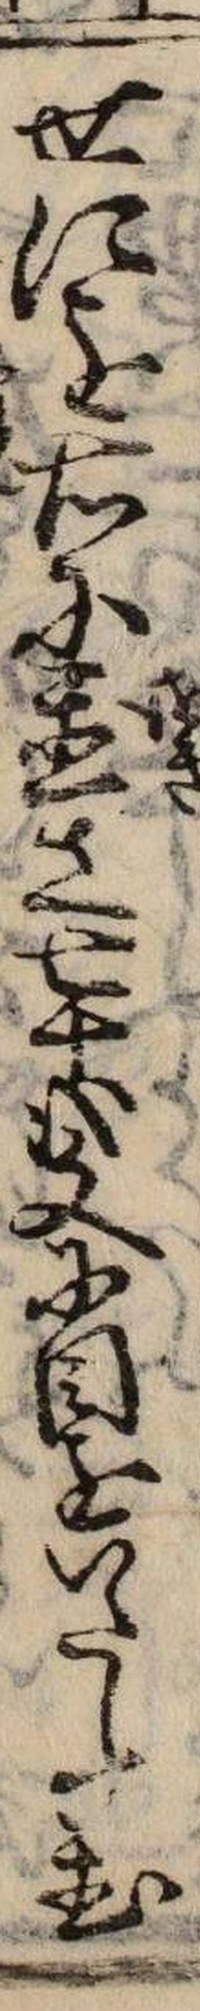せにを右に置先七十弐文に目をいたして置
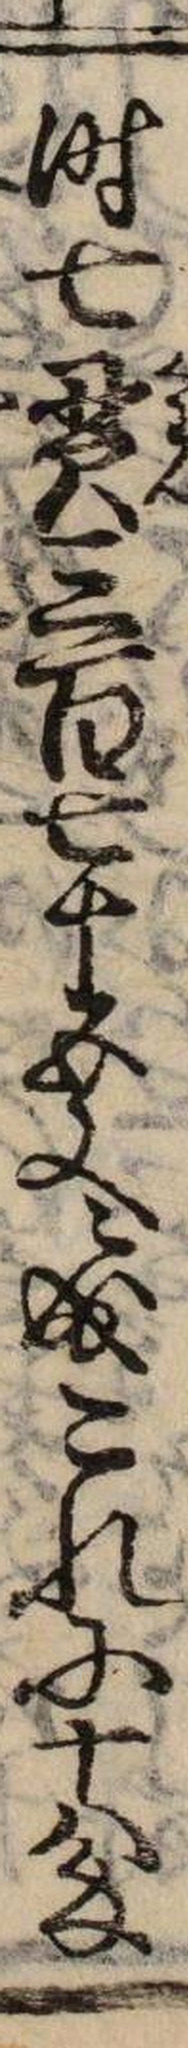一８(黒)時七貫三百七十五文に成これに十八匁
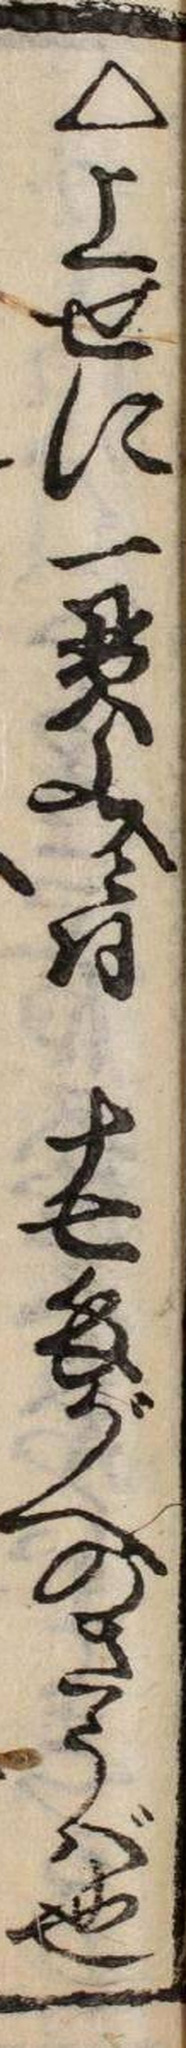△上せに一貫文に付十七匁がへのさうば也
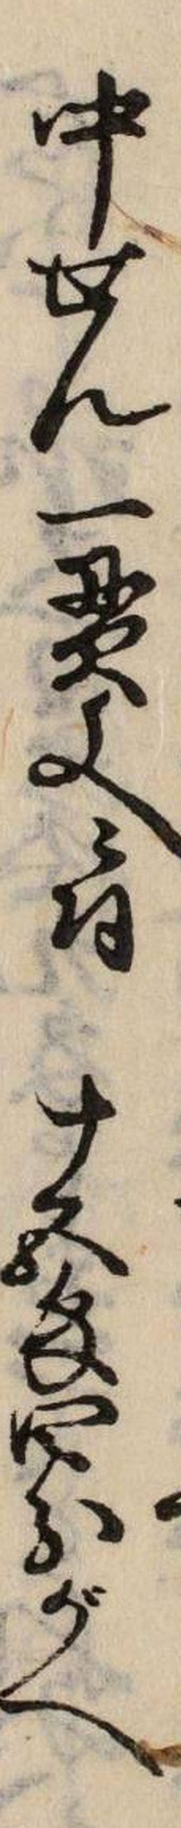中せん一貫文に付十五匁四分がへ
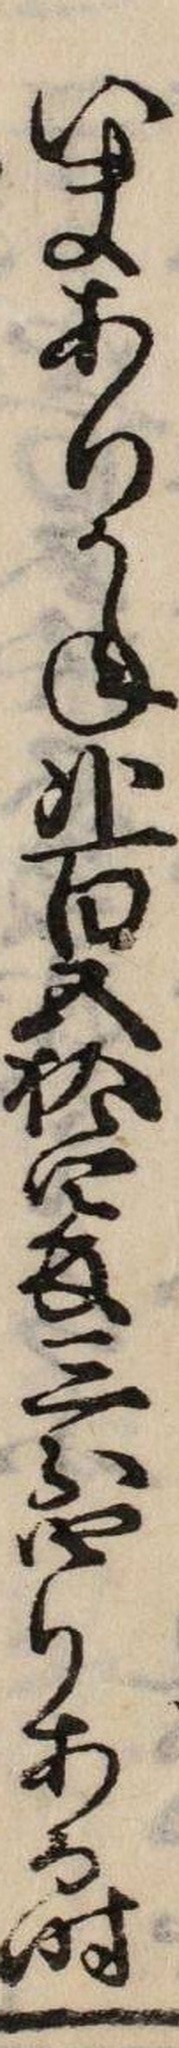いまありかね弐百五拾四匁三分四りある時
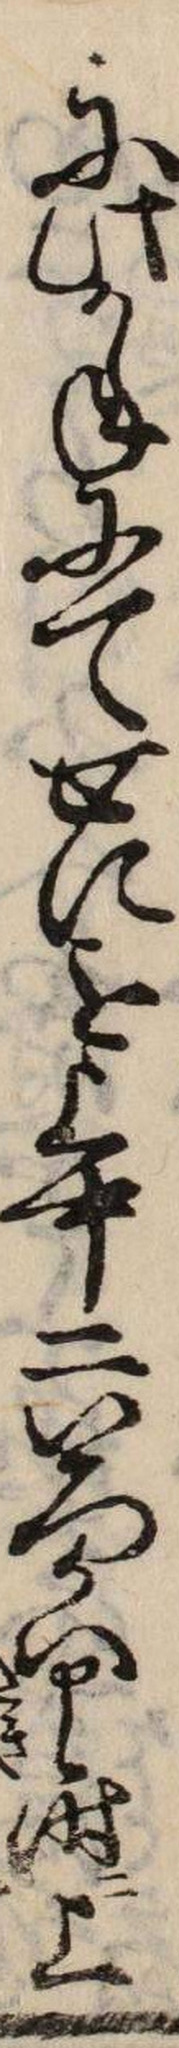に此かねにてせにを上中二いろかい申時に上
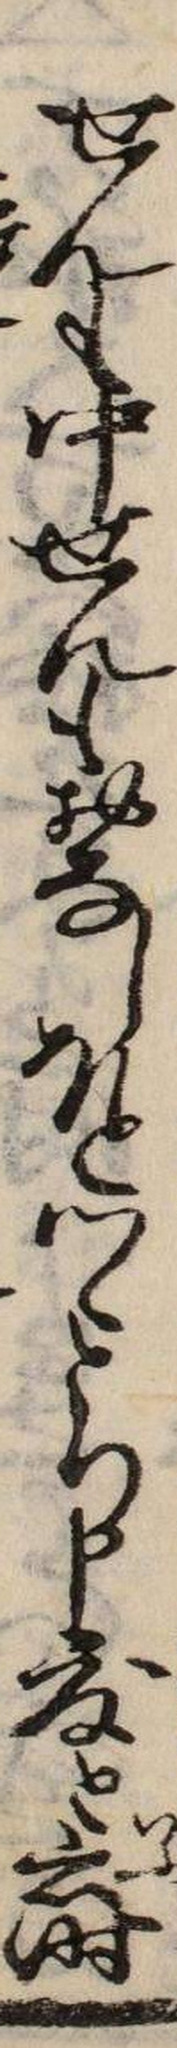せんも中せんもおなしほとつゝとり申度と云時
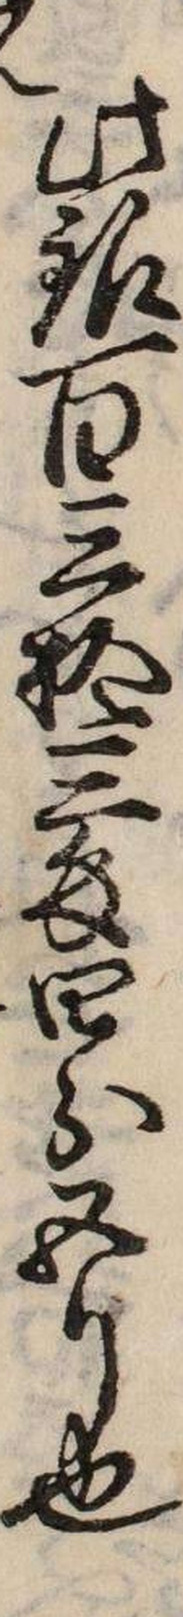此銀百三拾三匁四分五り也
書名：塵劫記（寛永11年自跋、京都府立京都学・歴彩館追貴8）
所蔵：京都府立京都学・歴彩館 国文学研究資料館
